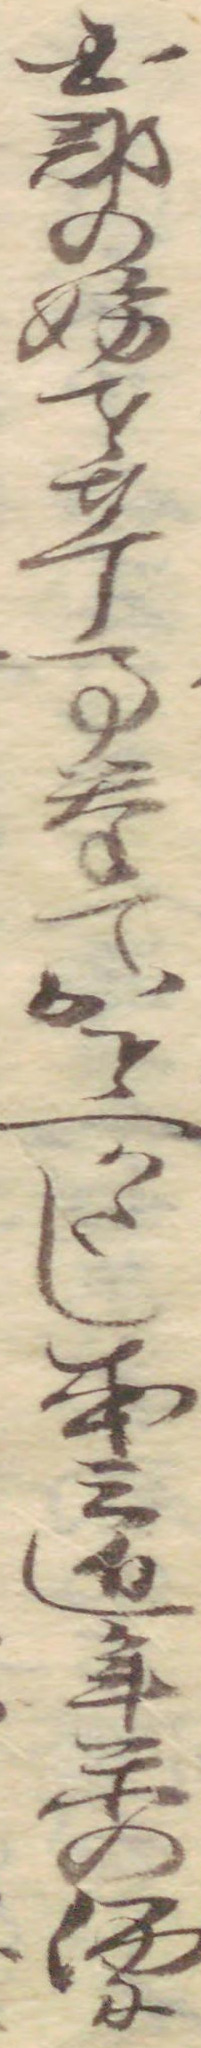国郡の妨をなす事挙てかそへかたし或云近年米の酒に
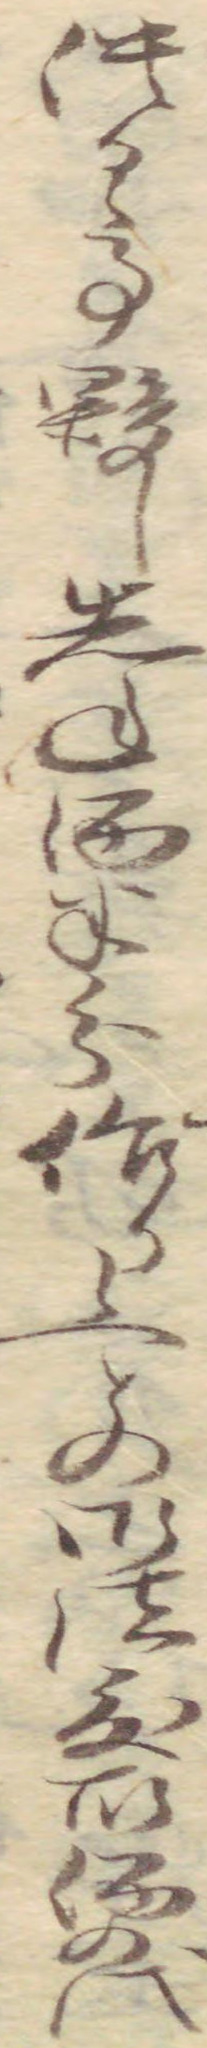潰るゝ事夥し先年酒半分作り候へとの御法度故酒の代
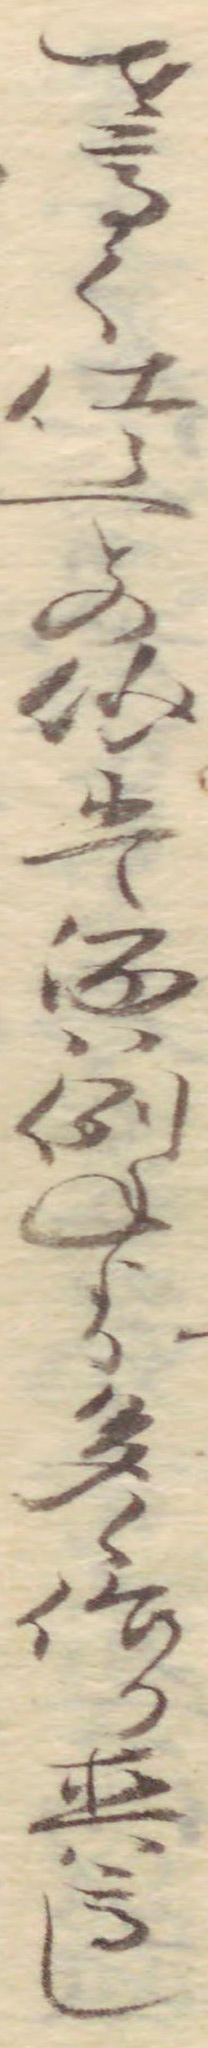を高く仕候へとの儀にて酒は例年より多く作り直は高し
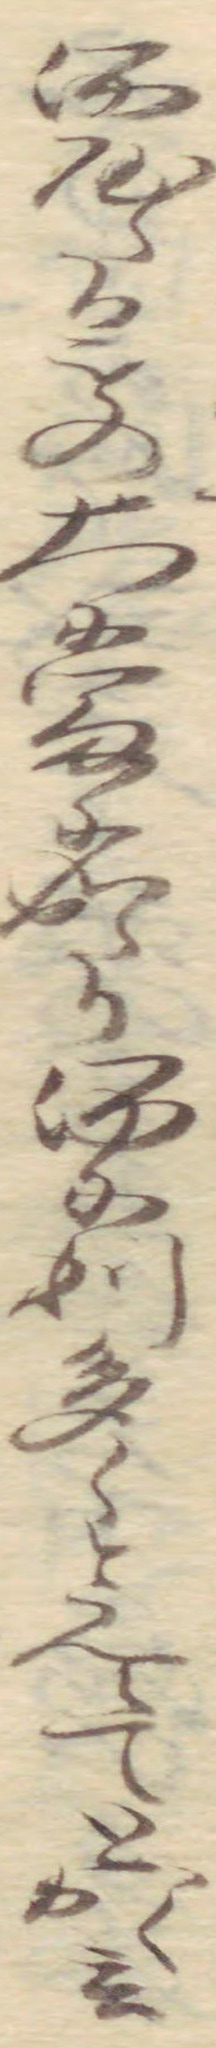酒屋たるもの大に富に成たり酒に利多くと見えてとかく言
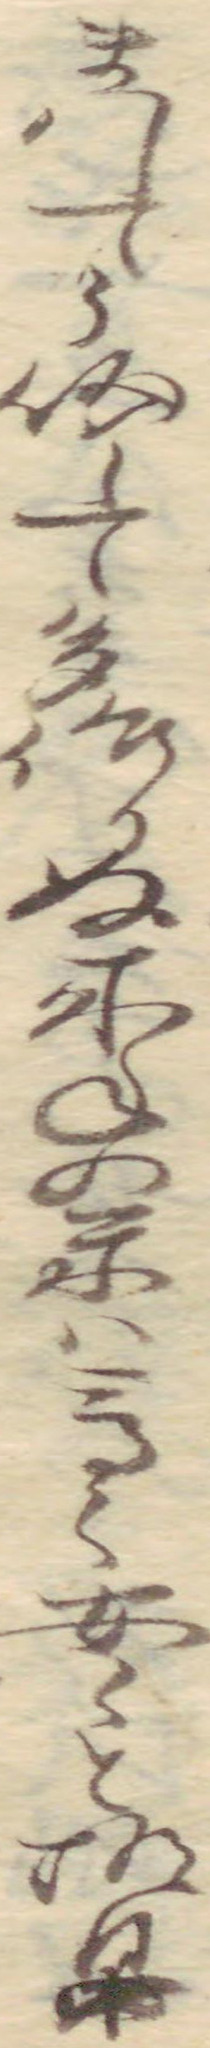まわしてう儀して多作りぬ来年の米は高く安くと極月中
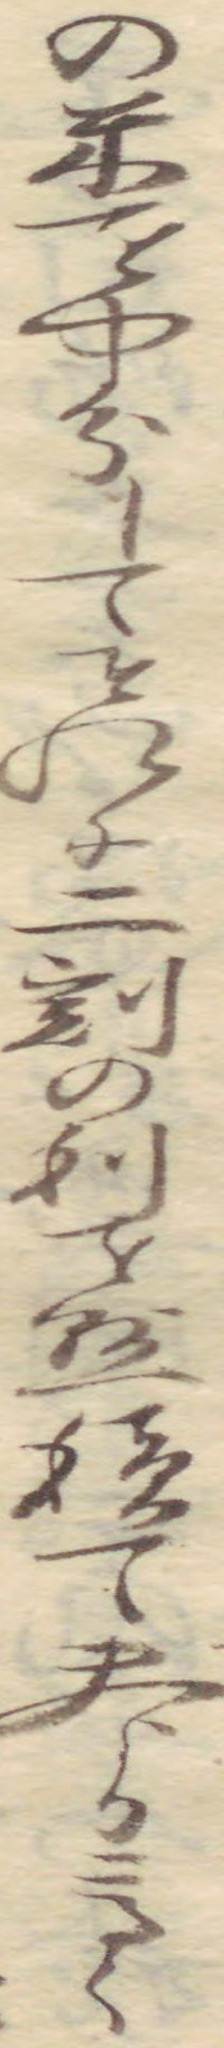の米を中分してそれに二割の利を懸積て夫より高く
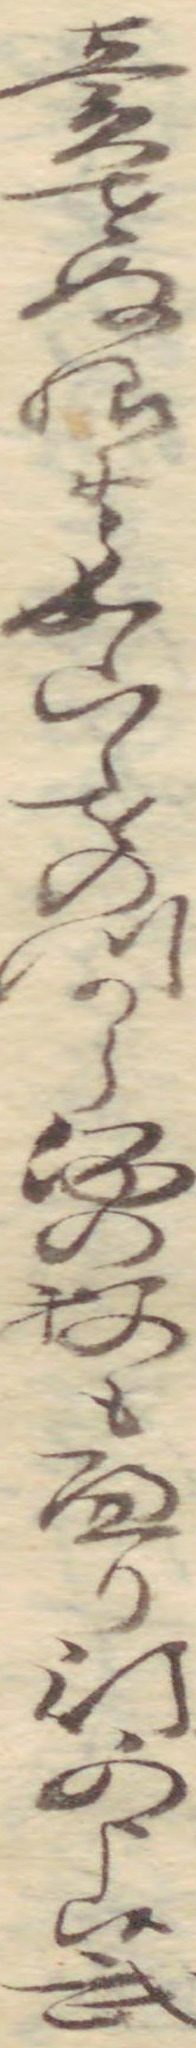売せぬ様に被成候はゝをのつから酒の数もへり行可申候武
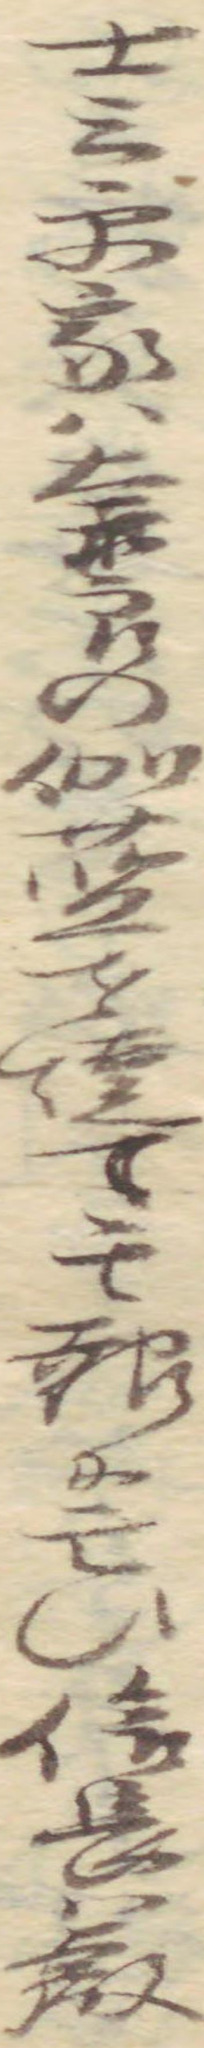士云平家は奈良の伽藍を焼て其報に亡ひ信長は叡
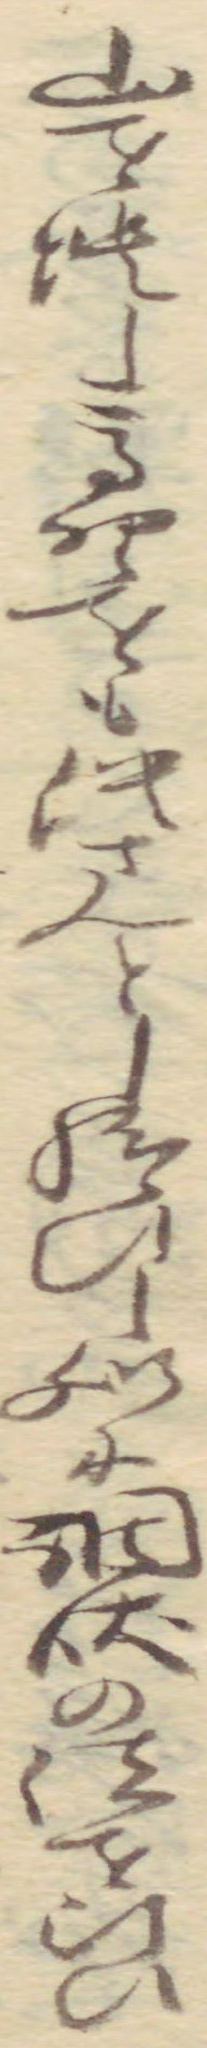山を潰し高野をも潰さんとし給ひし処に調伏の法を行ひ
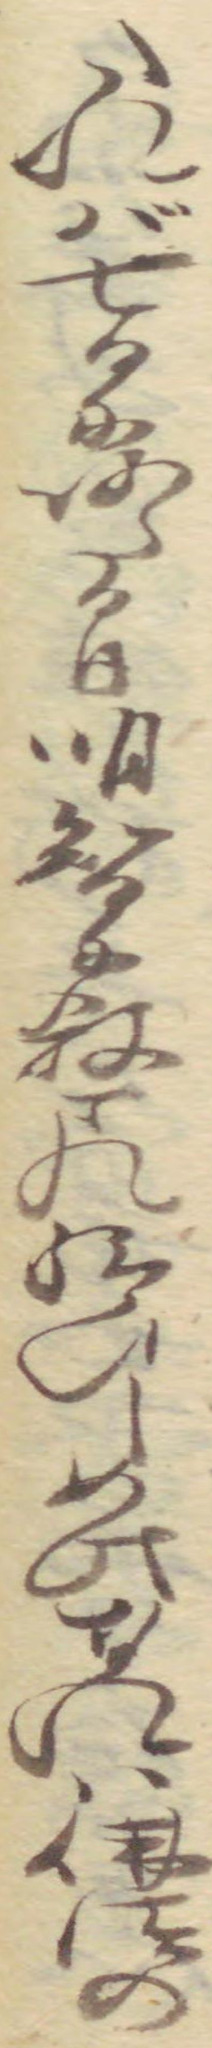たれば七日にあたる日明智に殺され給ひし如此なれは仏法の
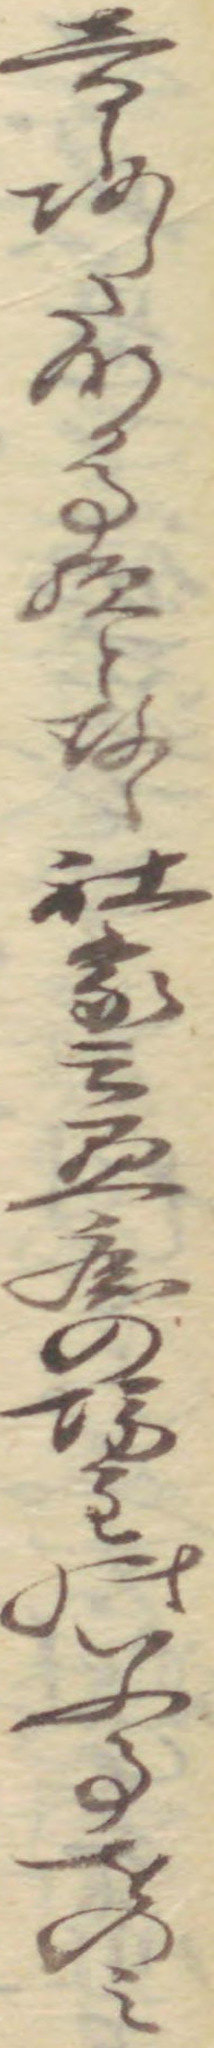しるしあらたなる事歟と存候社家云愚痴の坊主のいふ事をのみ
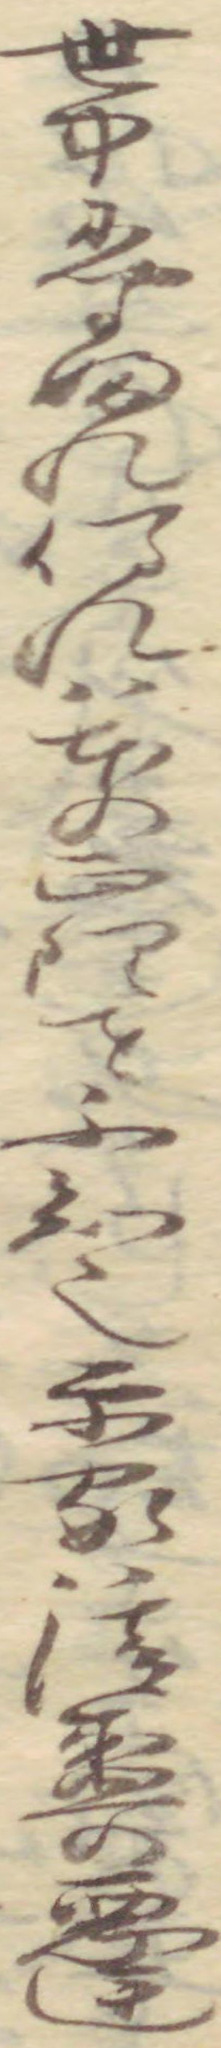世中に聞ふれ侍れは本の正理を不知也平家は清盛の悪逆
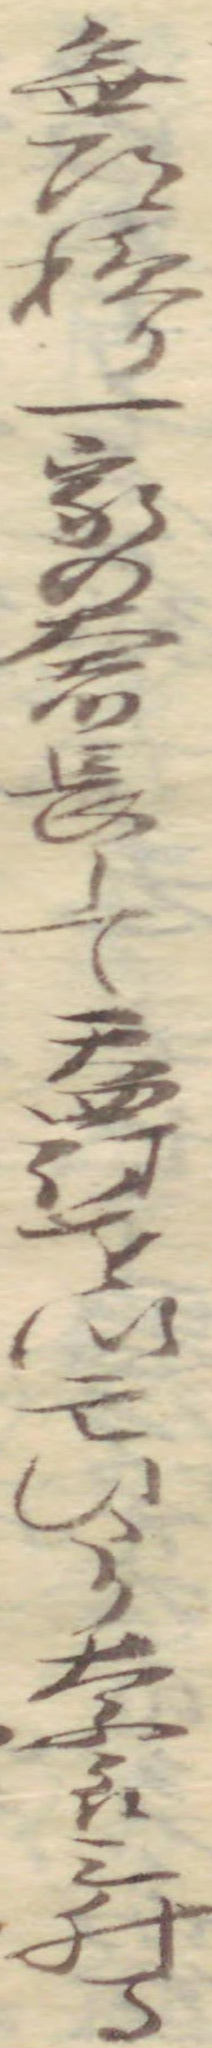無道積り一家の奢長して天罰を以亡ひたり奈良三井寺
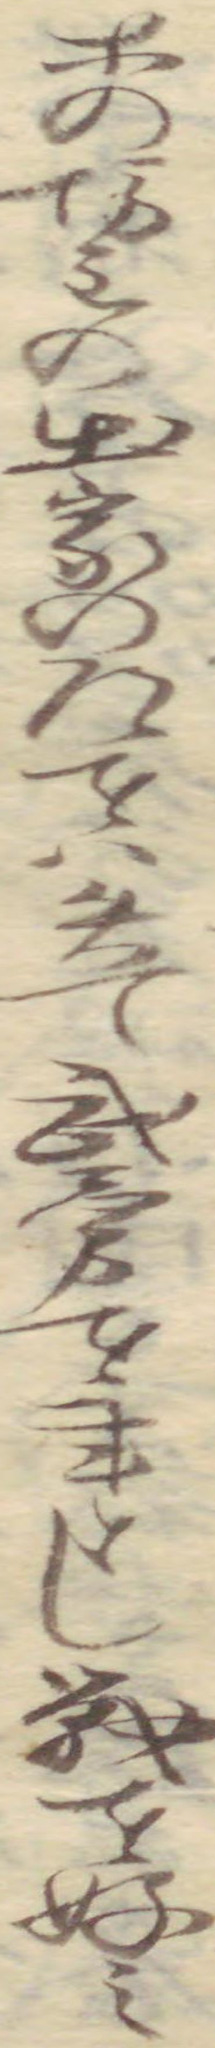等の坊主の出家の道をは失て武勇を事とし戦を好み
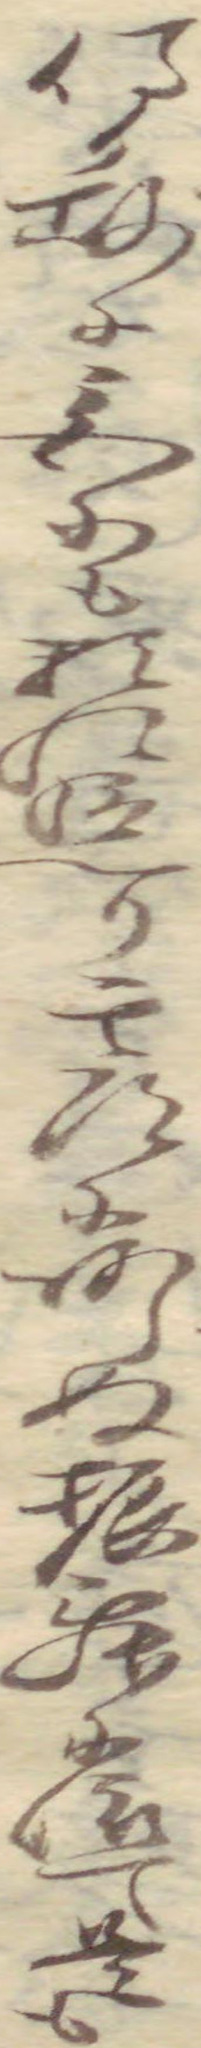侍る故に宮にも頼れ給へり其道にあらぬ振舞に依て是も
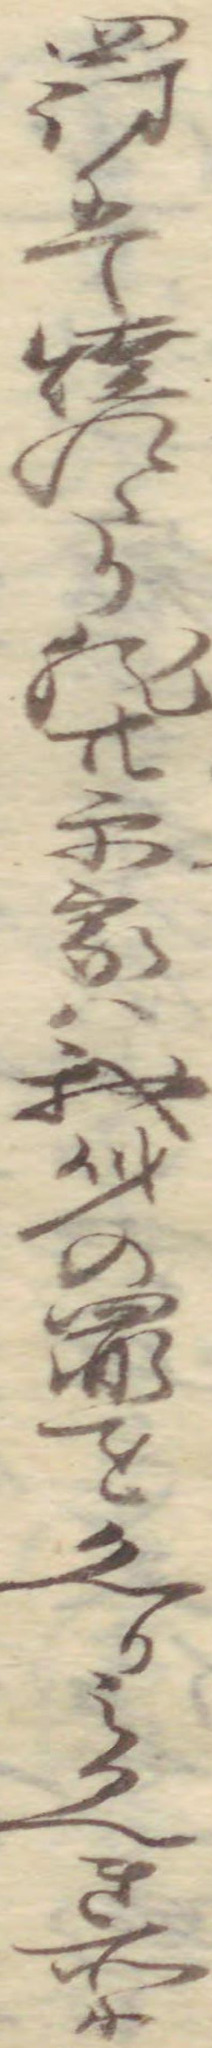罰にて焼れたり然共平家は我身の罪をかへりみるへき所に
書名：鶯宿雑記. 巻263-264
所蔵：国立国会図書館 National Diet Library, JAPAN
